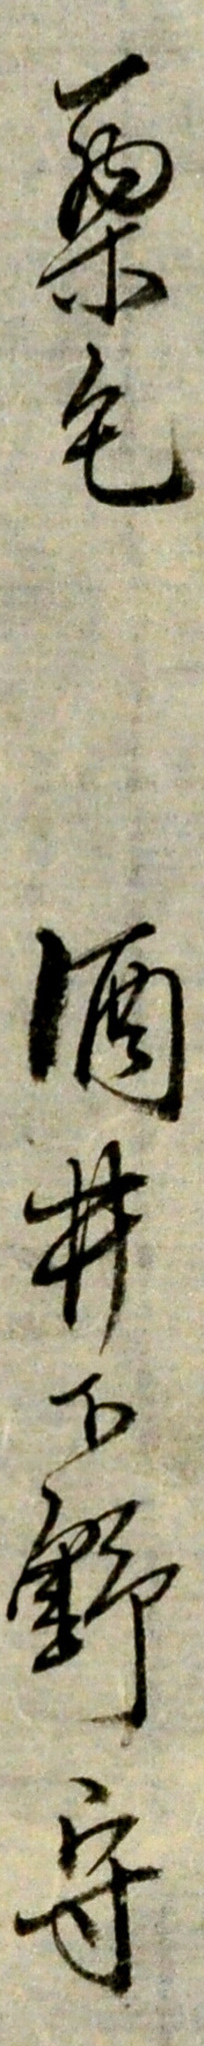栗毛酒井下野守
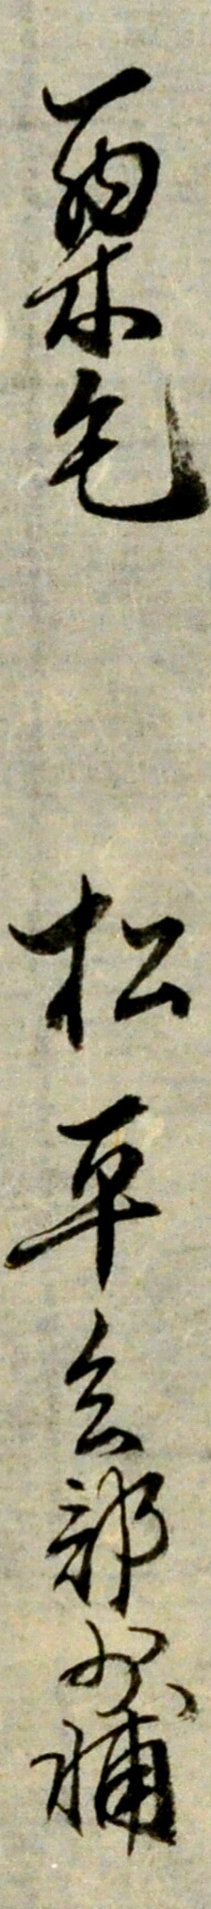栗毛松平兵部少輔
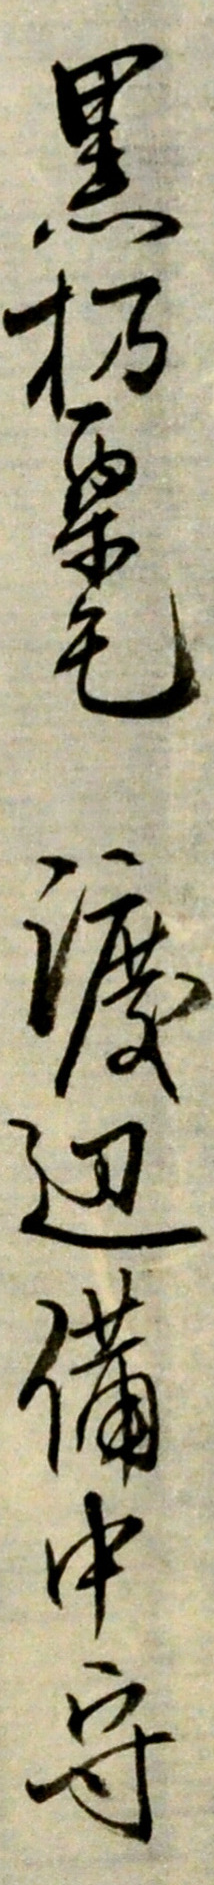黒栃栗毛渡辺備中守
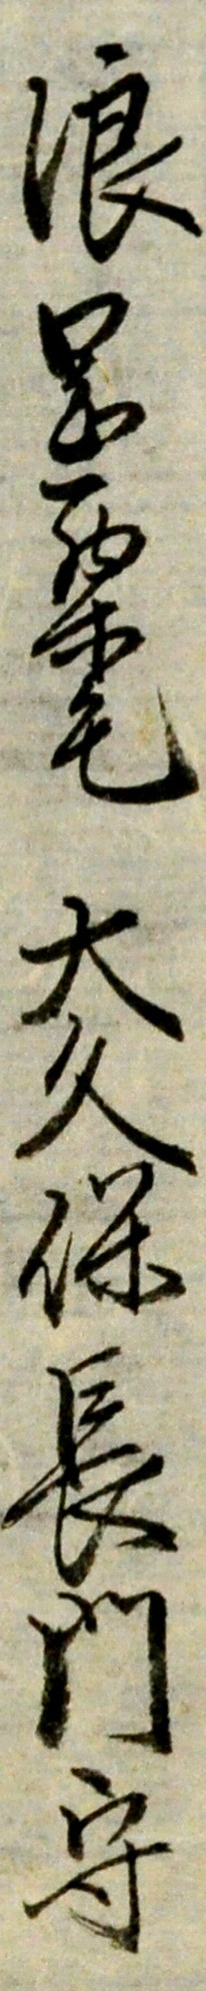浪岡栗毛大久保長門守
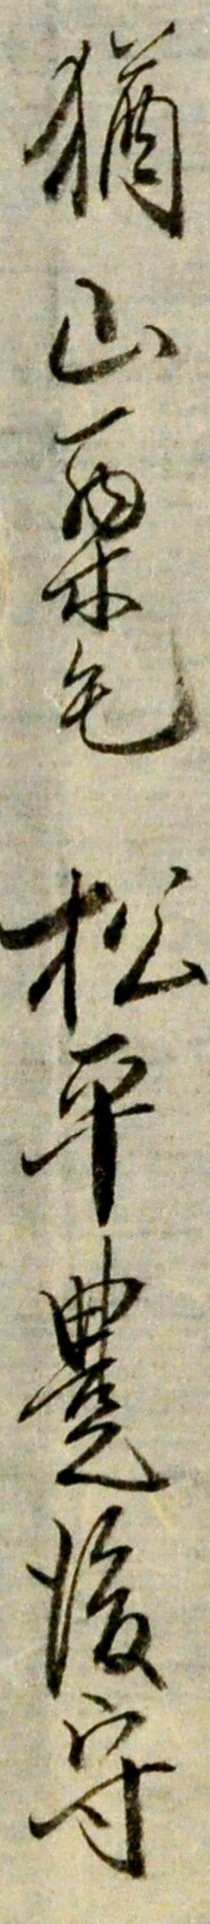猶山栗毛松平豊後守
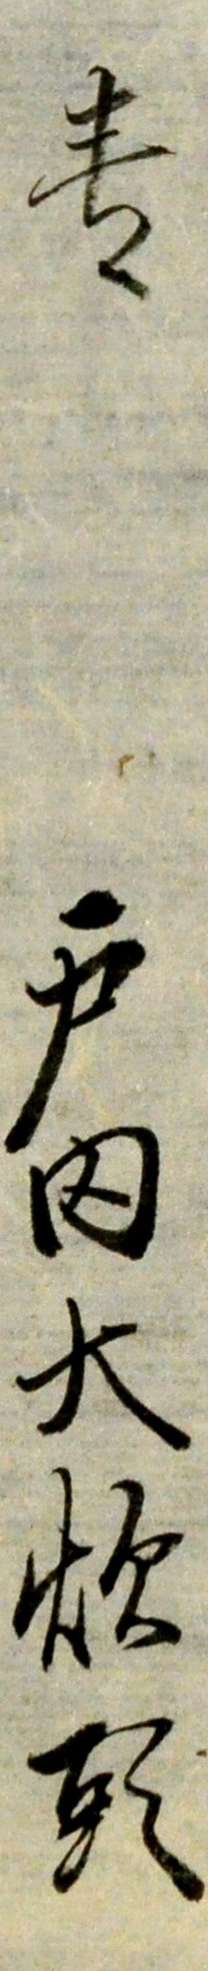青戸田大炊頭
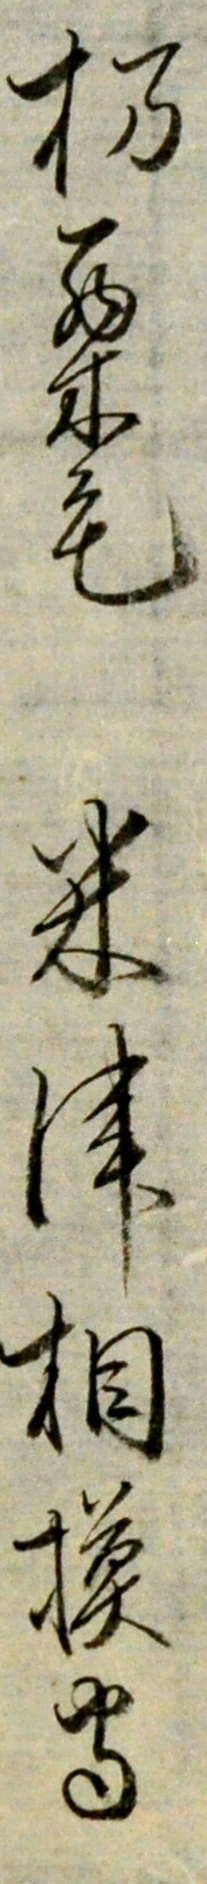栃栗毛米津相模守

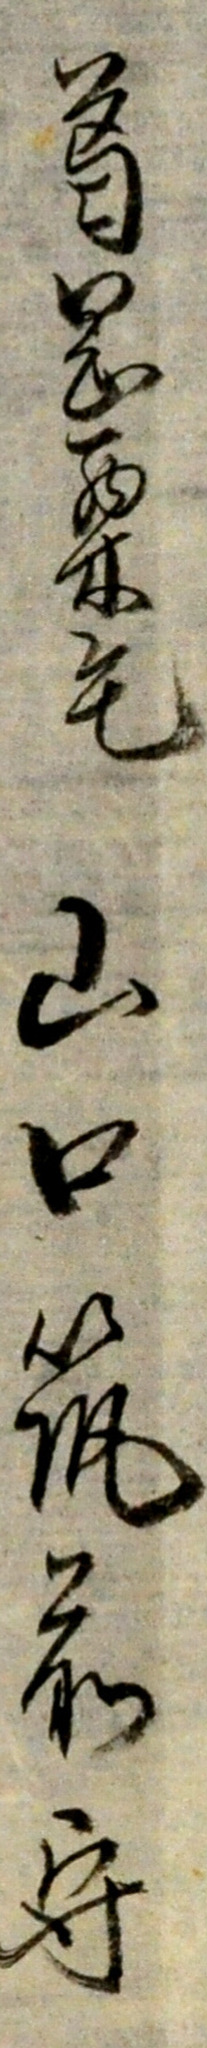葛岡栗毛山口筑前守
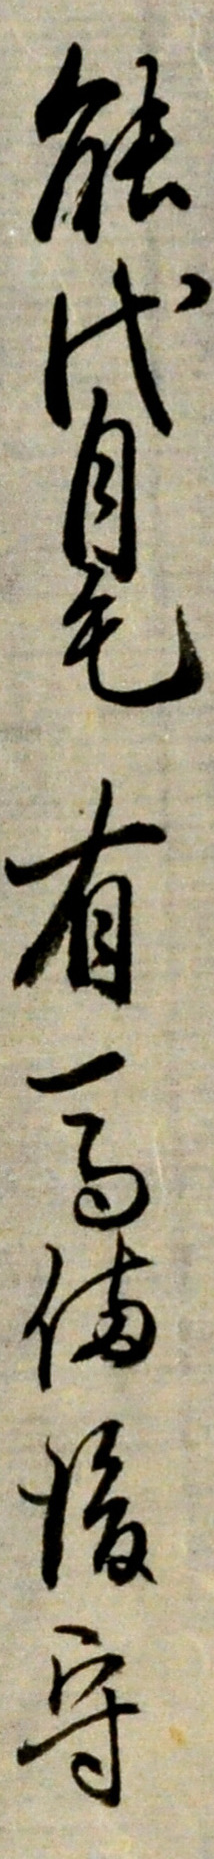能代月毛有馬備後守
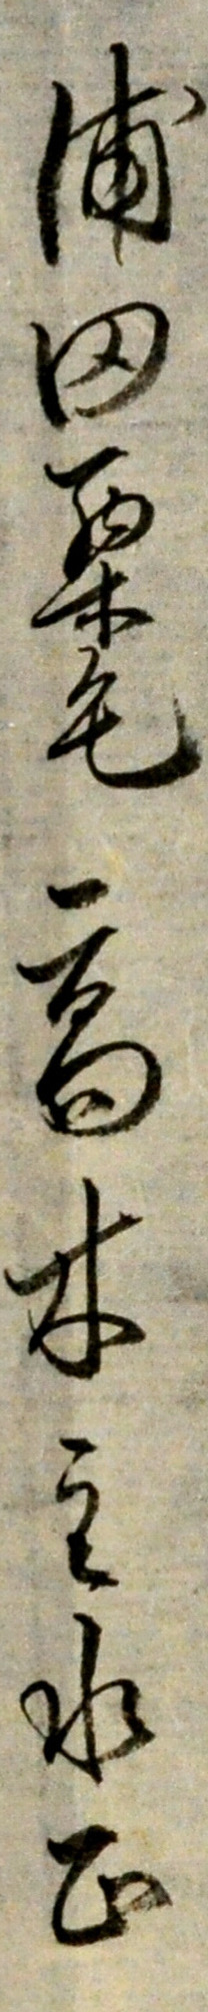浦田栗毛高木主水正
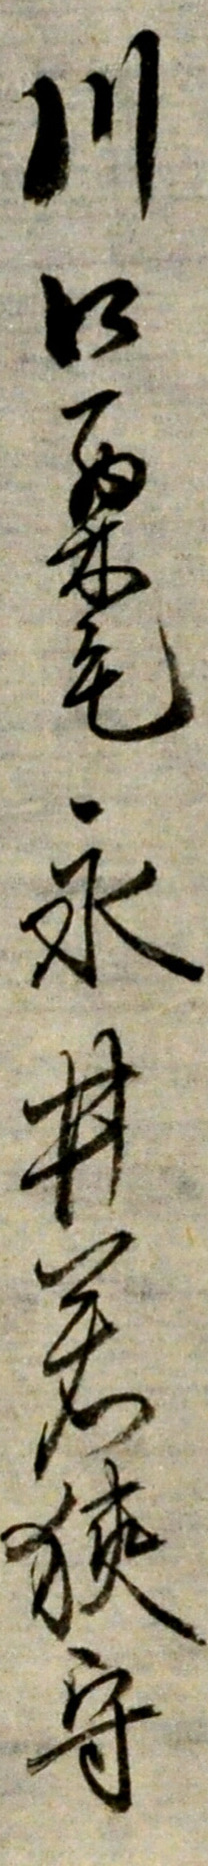川口栗毛永井若狭守
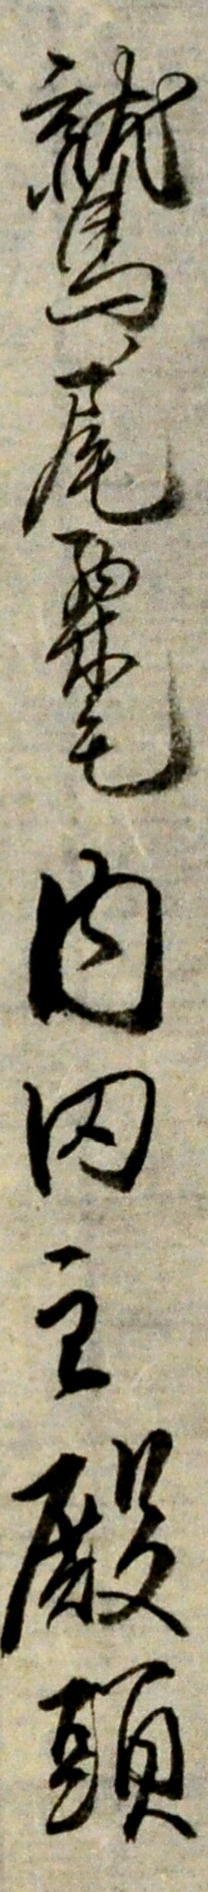鷲ノ尾栗毛内田主殿頭
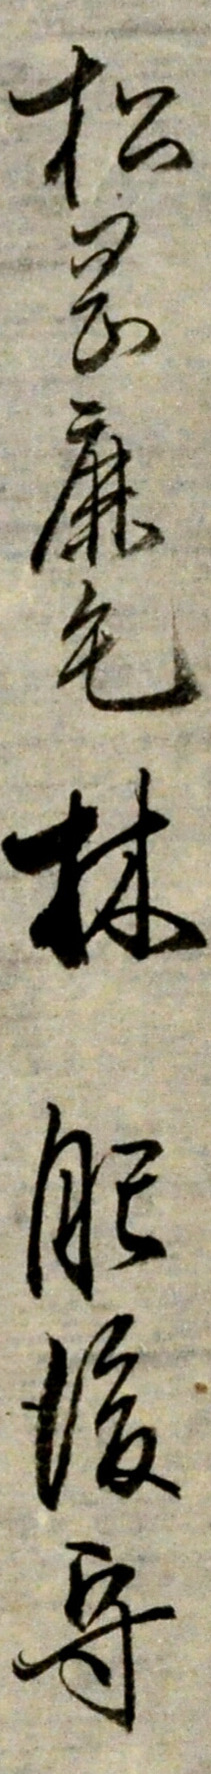松岡鹿毛林肥後守
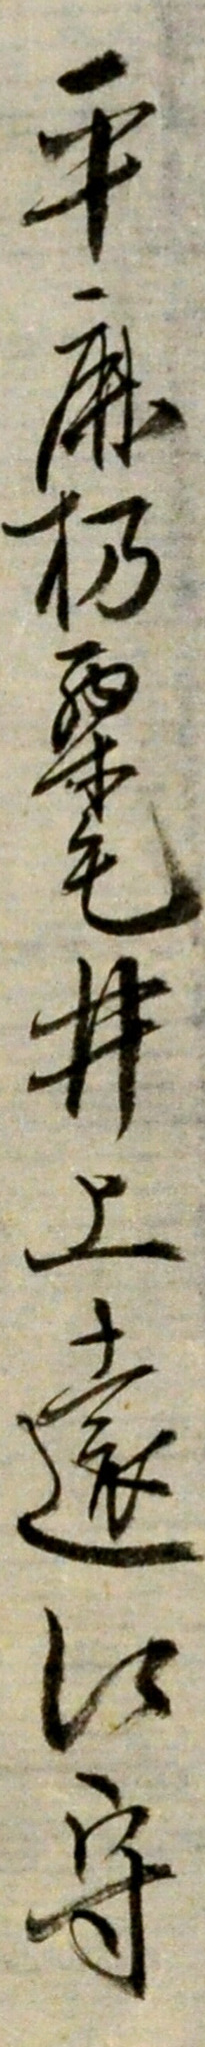平鹿栃栗毛井上遠江守

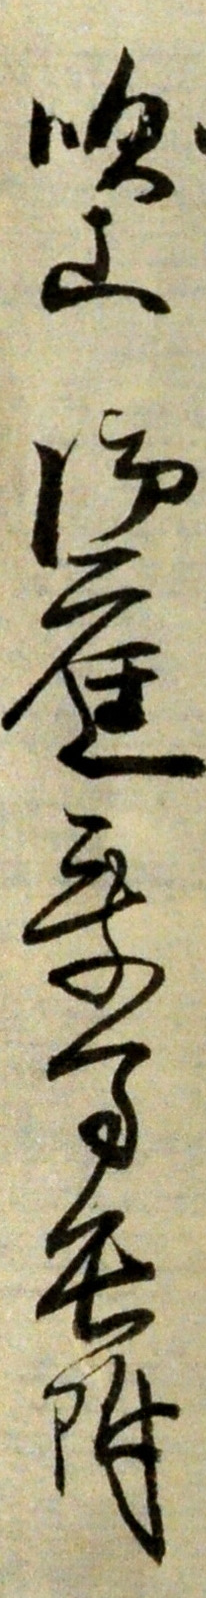吹上御庭乗馬長附

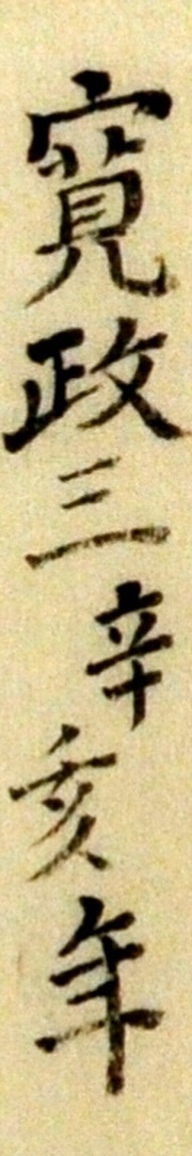寛政三辛亥年
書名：吹上御庭ニ於テ乗馬上覧ノ節留書外
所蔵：伊那市立高遠町図書館・合同会社AMANE
